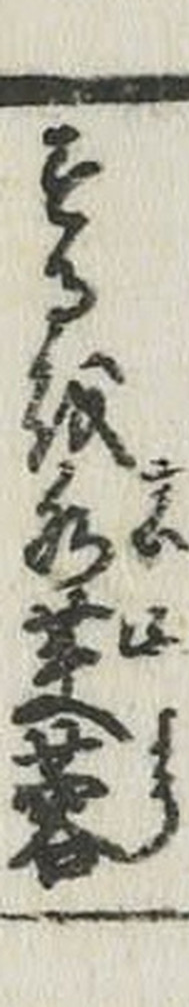するを水芙蓉
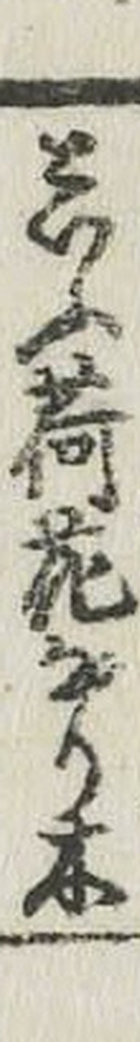といふ荷花なり木
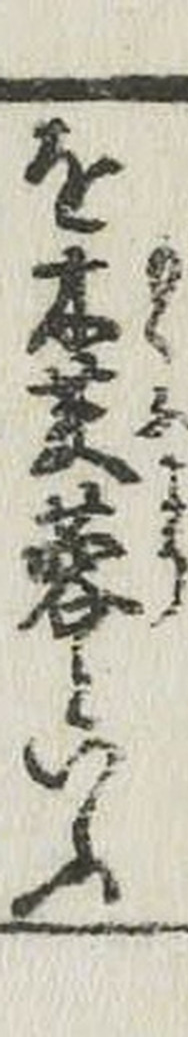を木芙蓉といふ
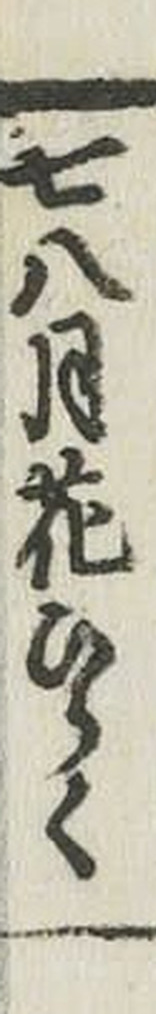七八月花ひらく
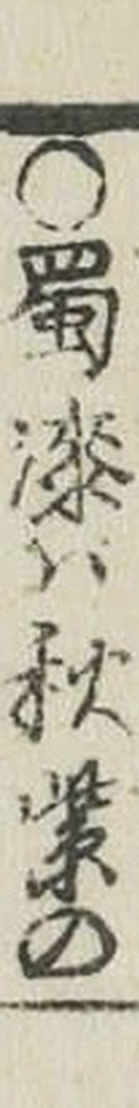○蜀漆は秋紫の
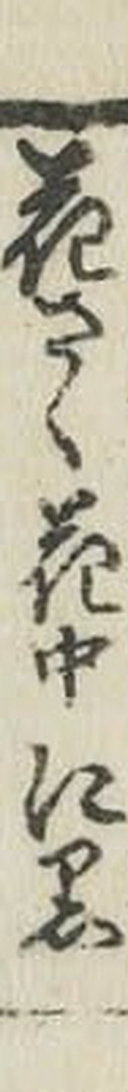花さく花中に黒
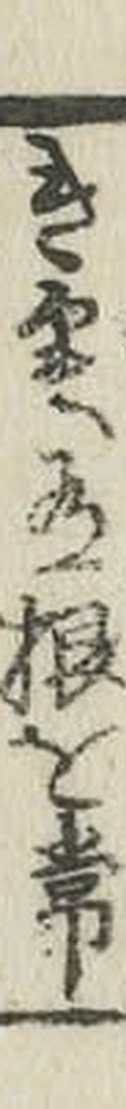き実有根を常
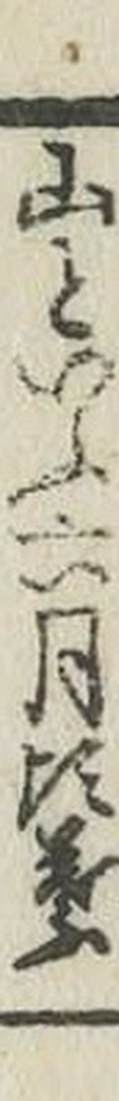山といふ六月頃葉
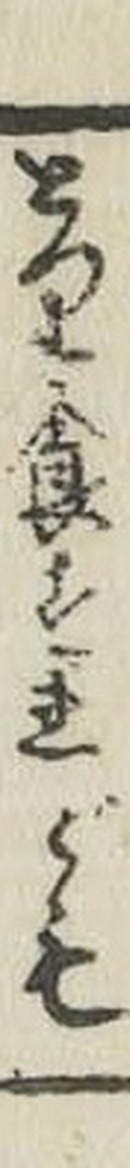とり食すれども
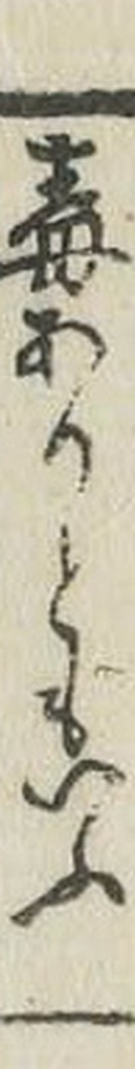毒ありともいふ
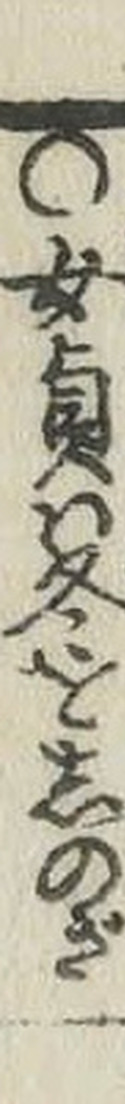○女貞は冬をしのぎ
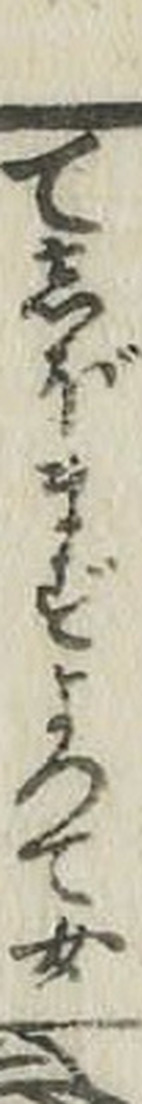てしぼまずよつて女
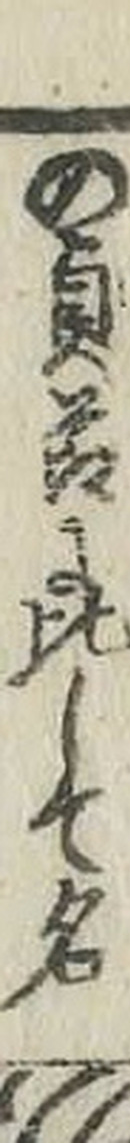の貞節に比して名
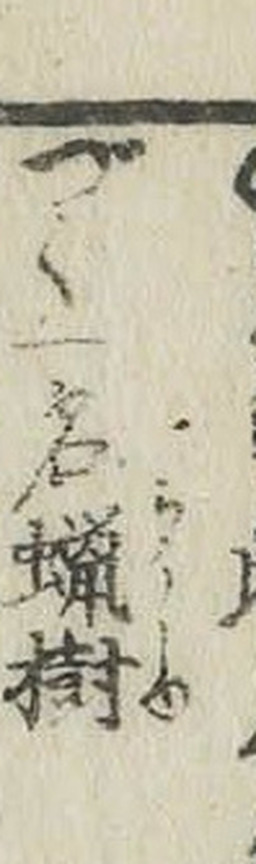づく一名蝋樹
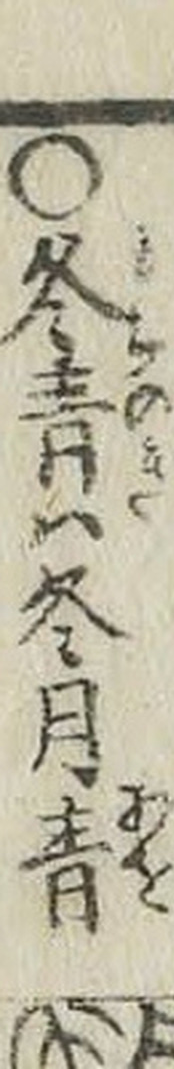○冬青は冬月青
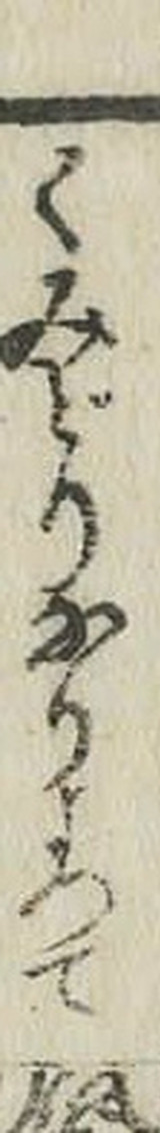くみどりなりよつて
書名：増補頭書訓蒙図彙大成 10巻 8:巻之17-19
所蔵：東京学芸大学教育コンテンツアーカイブ
